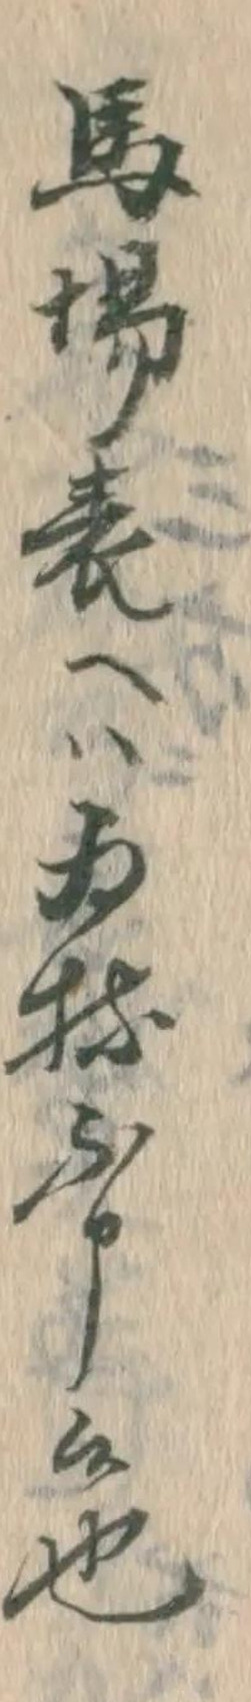馬場表へハ為持不申候也
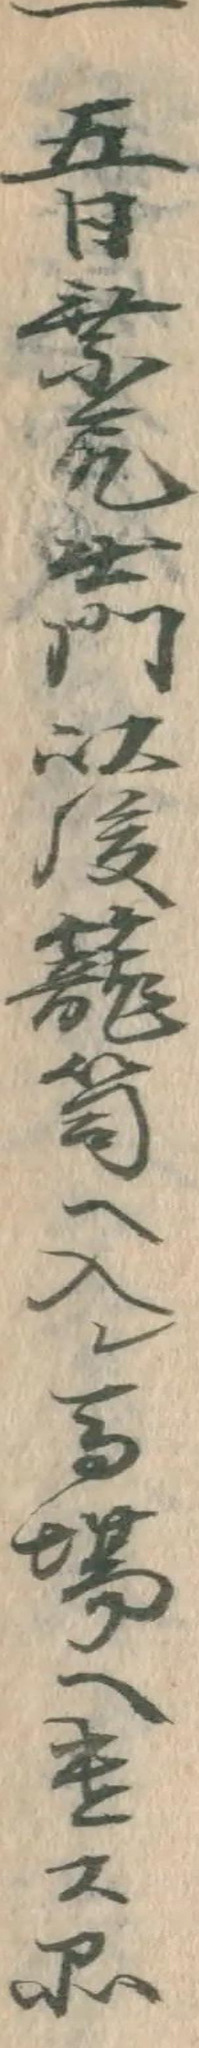一五日乗尻出門以後籠笥へ入レ馬場へ遣ス品

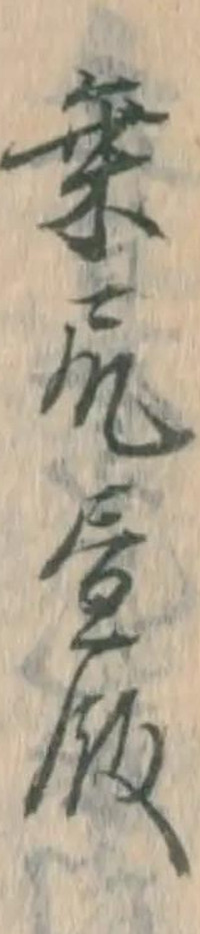乗尻昼飯
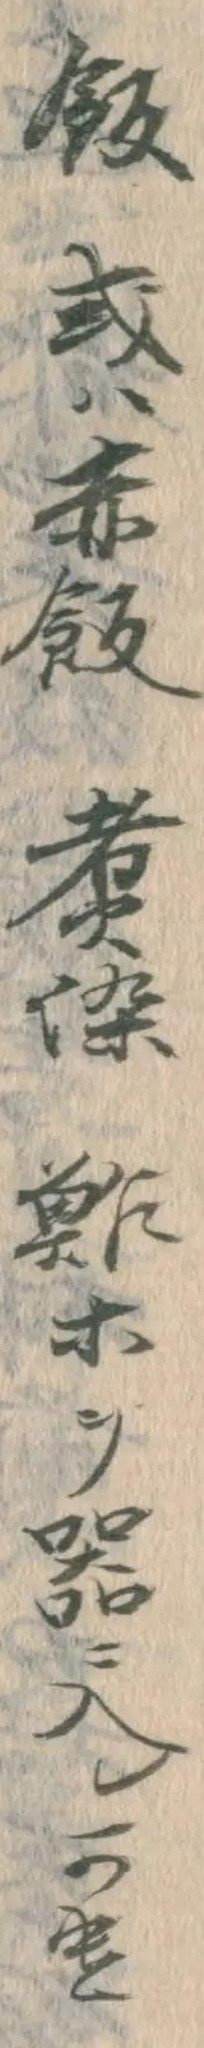飯或ハ赤飯煮染鮓等ヲ器ニ入レ可遣
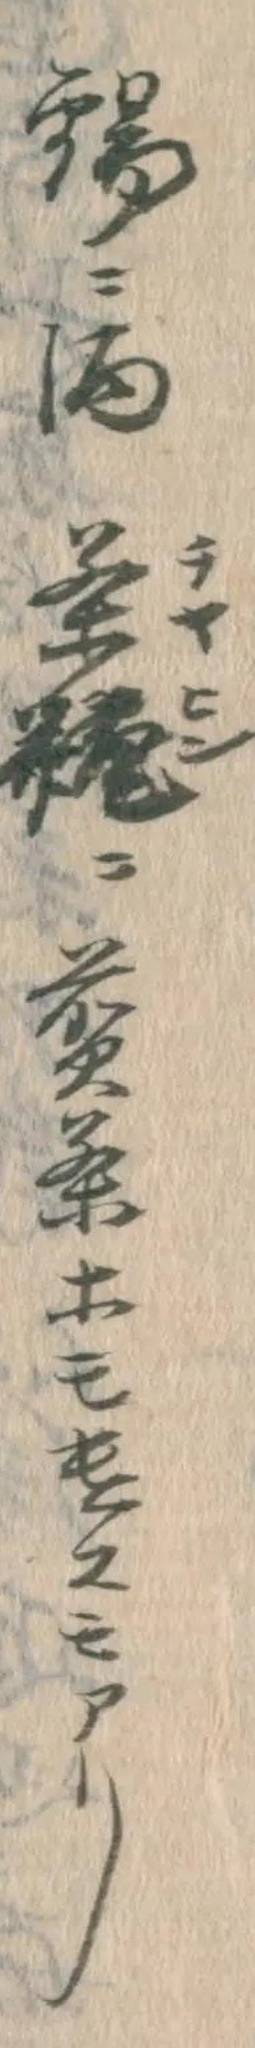鯣ニ酒茶瓶ニ煎茶等モ遣スモアリ
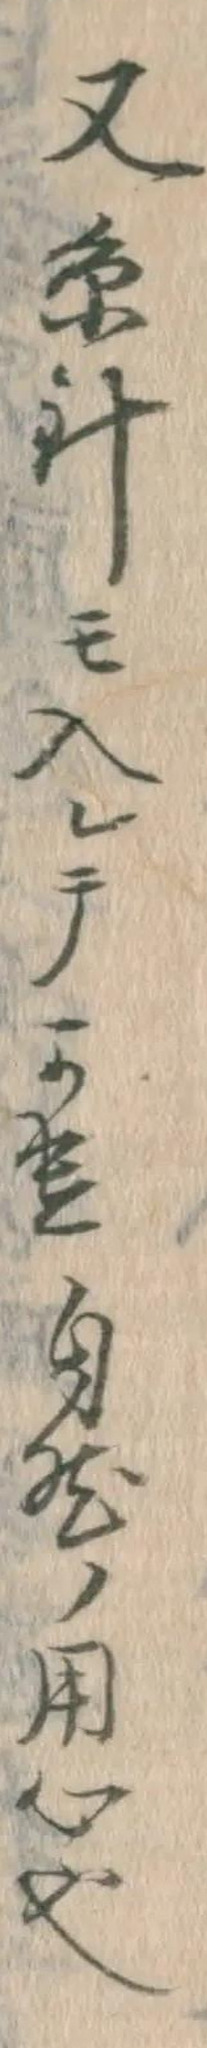又糸針モ入レテ可遣自然ノ用心也
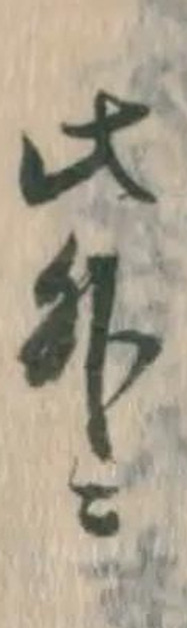此外ニ
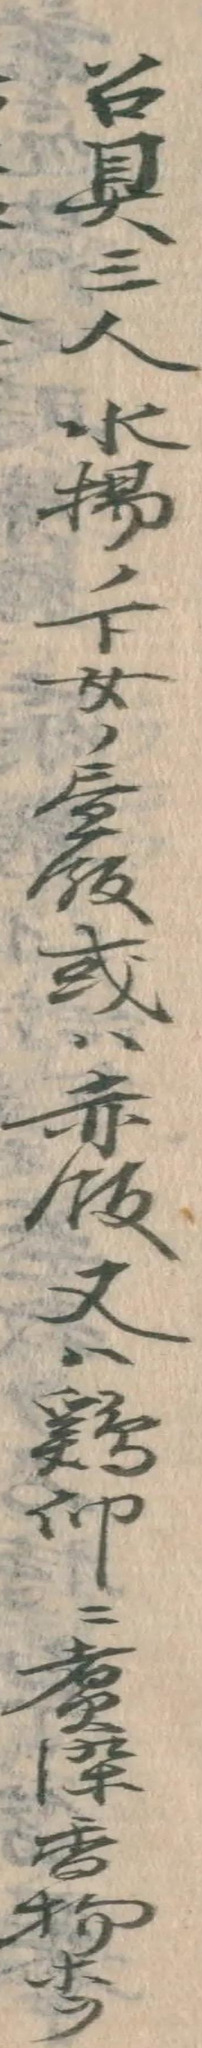召具三人水揚ノ下女ノ昼飯或ハ赤飯又ハ鶏卵ニ煮染香物等ヲ
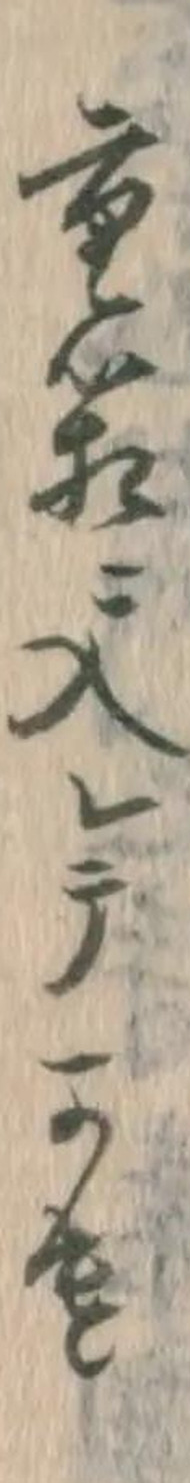重箱ニ入レテ可遣
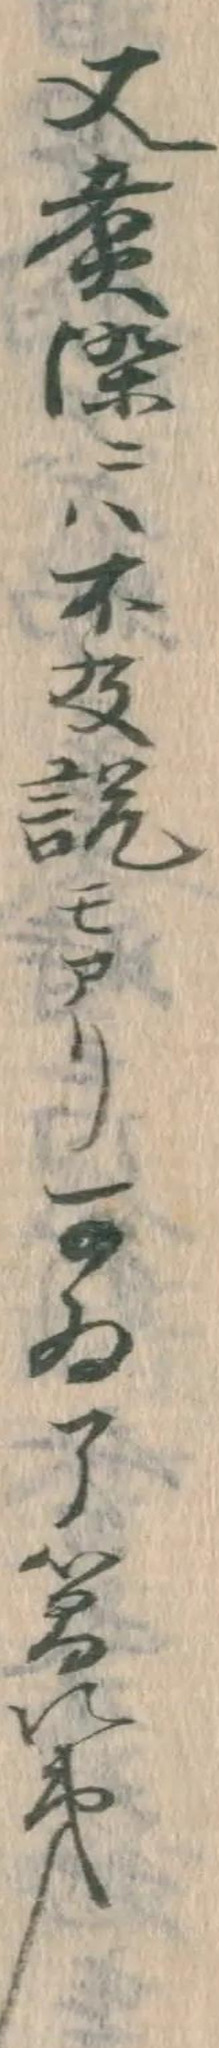又煮染ニハ不及説モアリ可為了簡次第
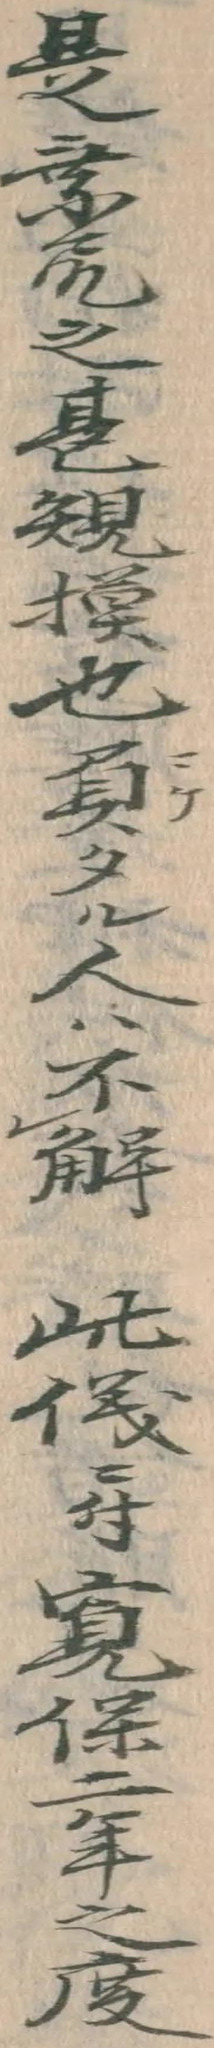是乗尻之甚規模也負タル人ハ不解此儀ニ付寛保二年之度
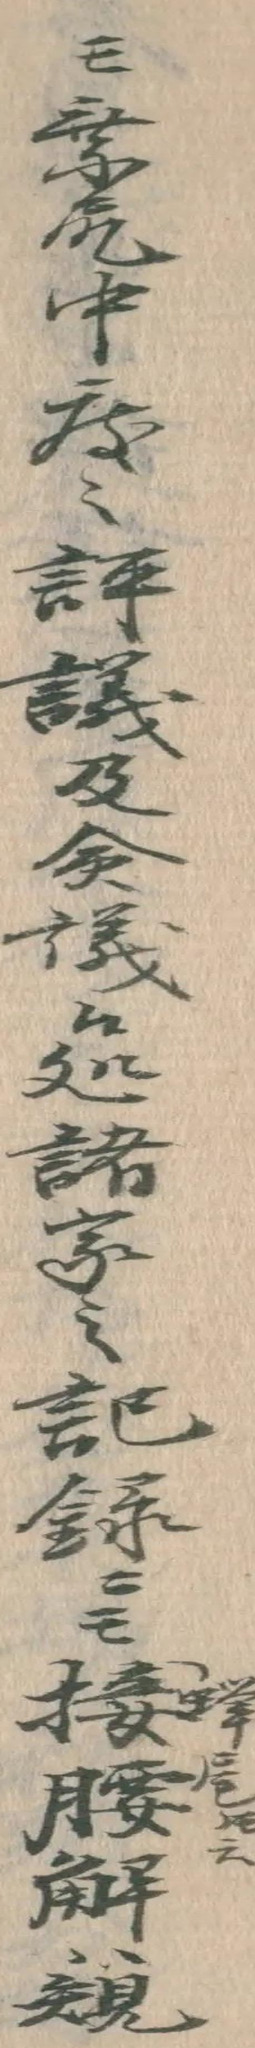モ乗尻中度々評議及僉議候処諸家之記録ニモ接腰解ハ規
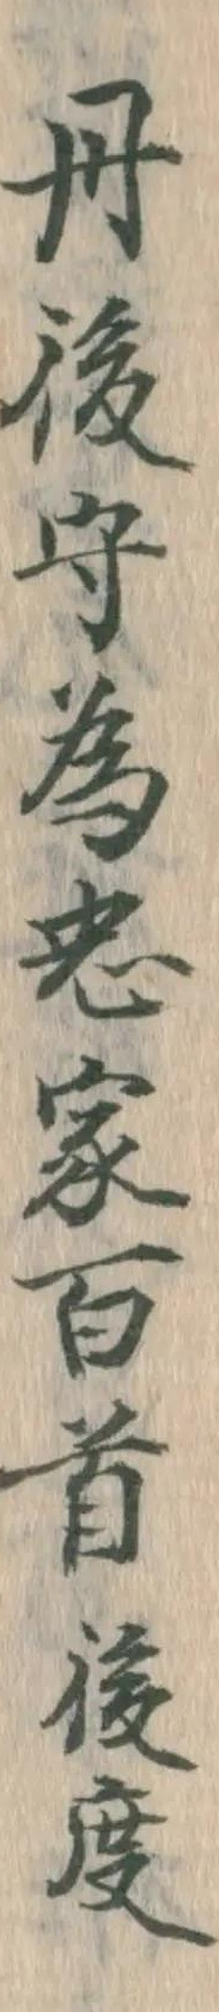丹後守為忠家百首後度
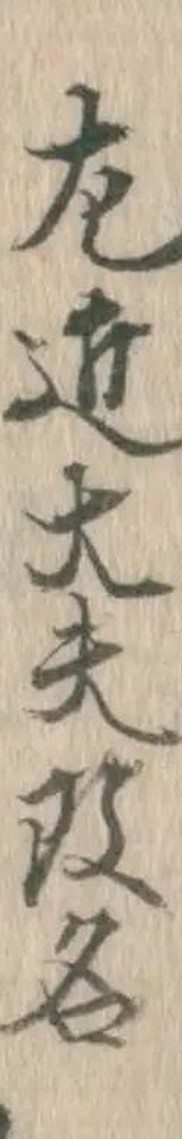左近大夫改名
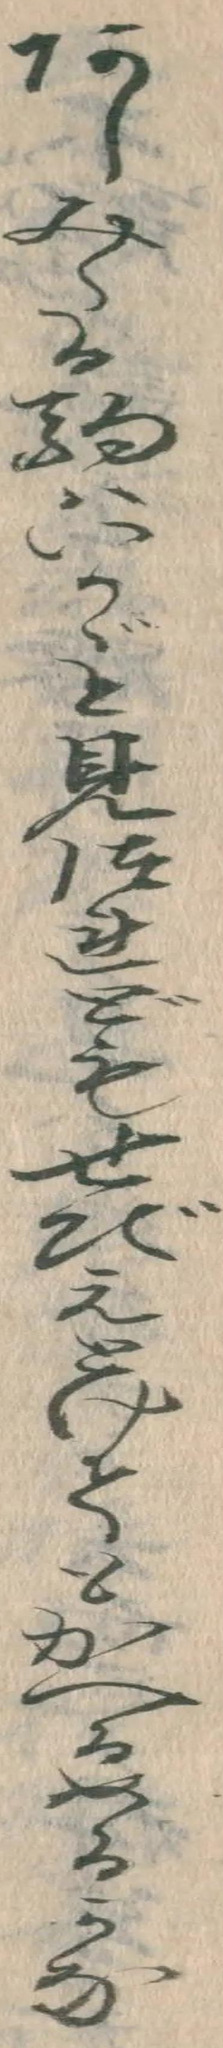あしみたる駒はいかゞと見つれどもせびえとけともかへるめるかな
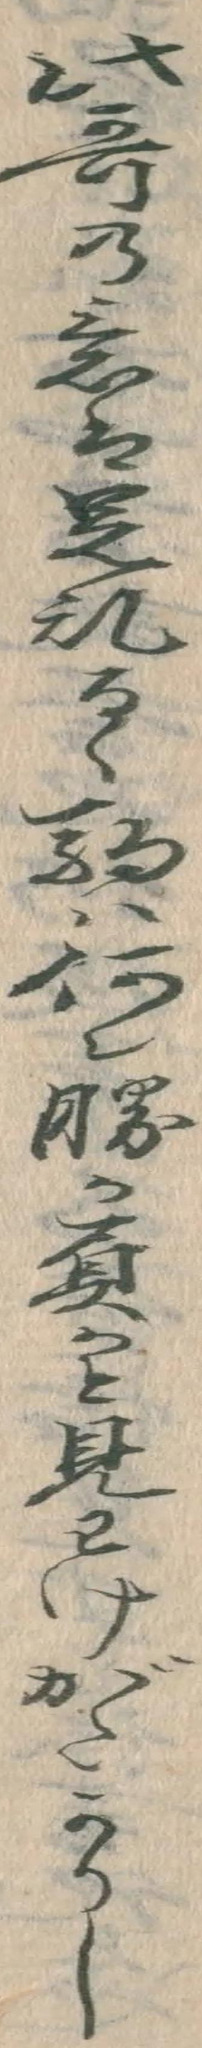此哥の意は足乱るゝ駒ハ何レ勝か負かと見わけがたかりし
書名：賀茂社記録. 第11冊
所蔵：国立国会図書館 National Diet Library, JAPAN
